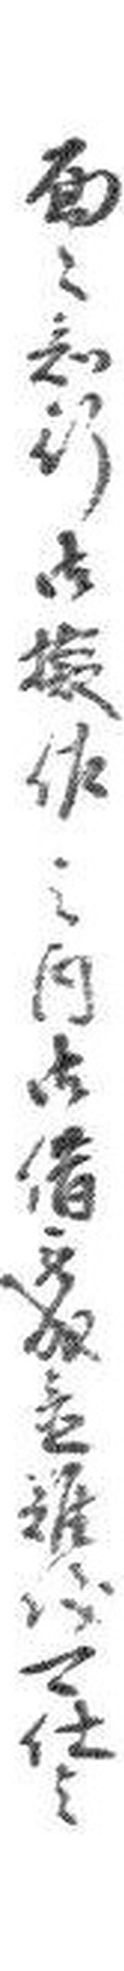面々知行御擬作之内御借被成置難儀可仕与
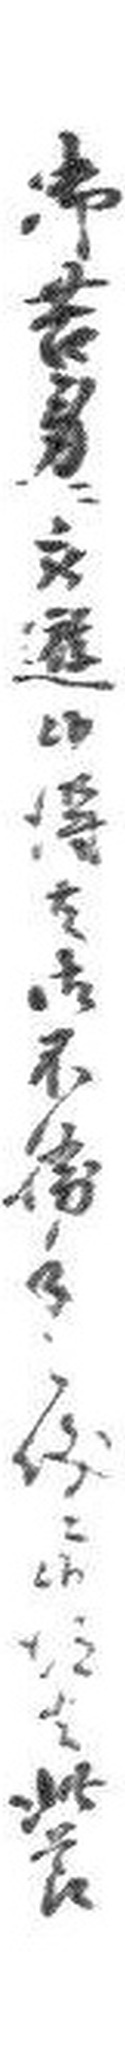御苦身ニ被遊候得共御不勝手之儀ニ候得共此節
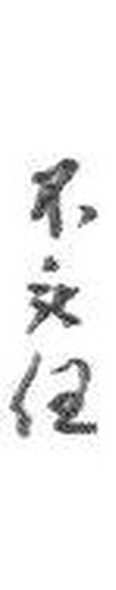不被任
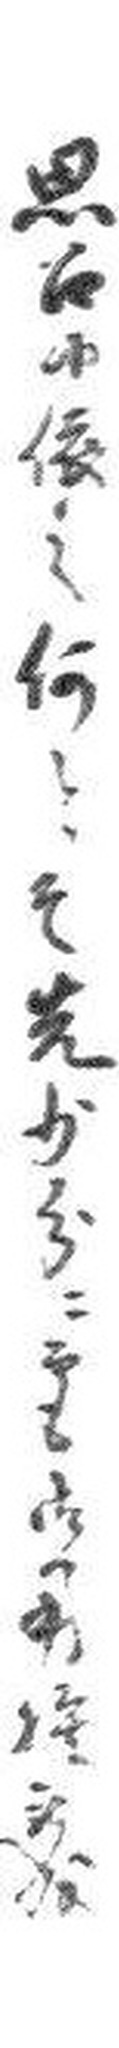思召候依之何とそ先少分ニ而も御用捨被成
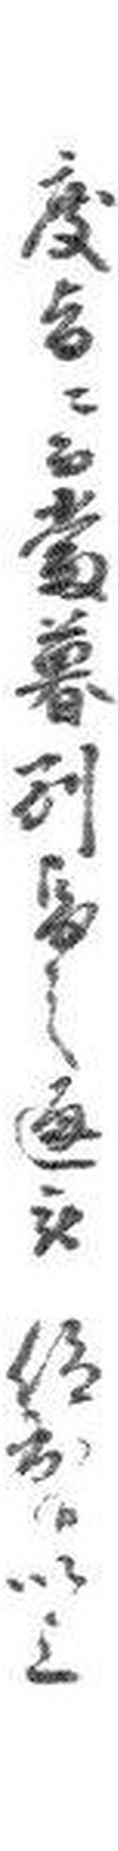度旨ニ而当暮別紙之通被仰出候以上
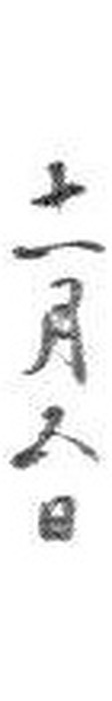十一月五日

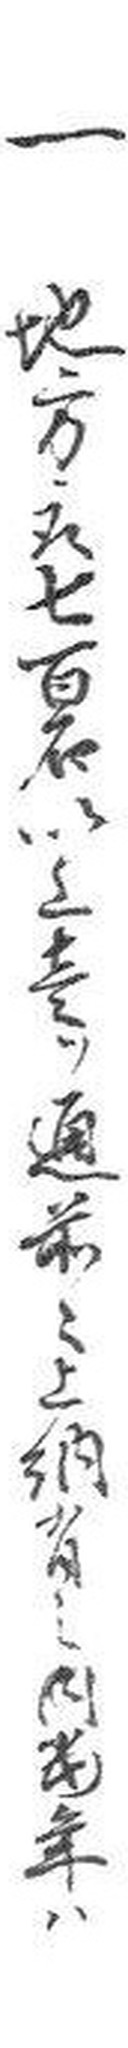一地方取七百石以上壱ツ通前々上納有之内当年ハ
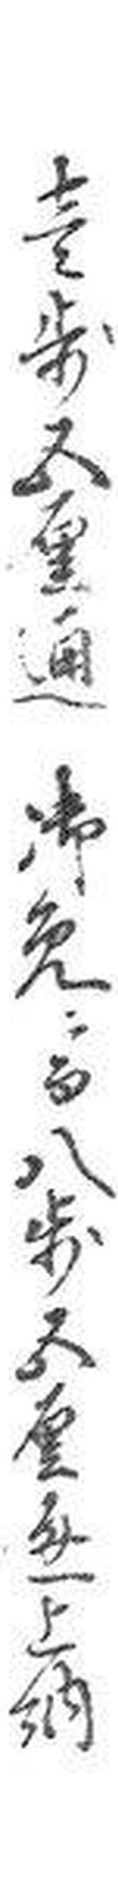壱歩五厘通御免ニ而八歩五厘通上納
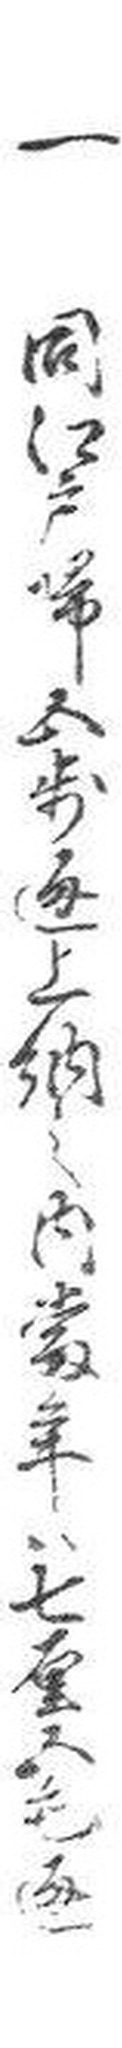一同江戸帰五歩通上納之内当年ハ七厘五毛通
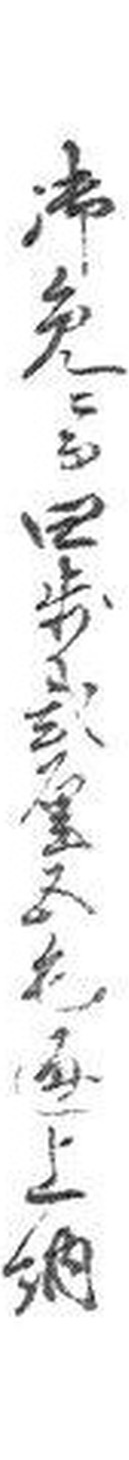御免ニ而四歩弐厘五毛通上納
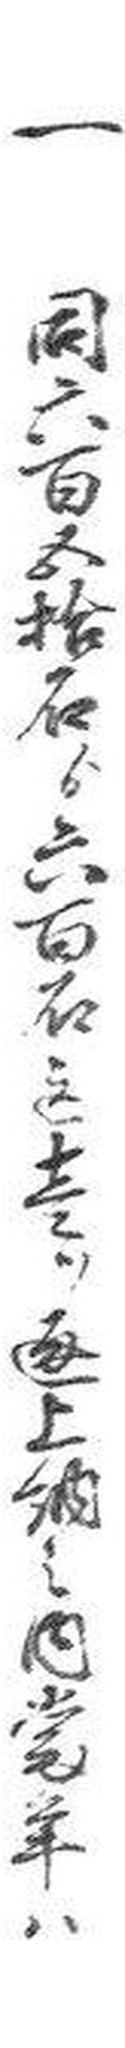一同六百五拾石ゟ六百石迄壱ツ通上納之内当年ハ
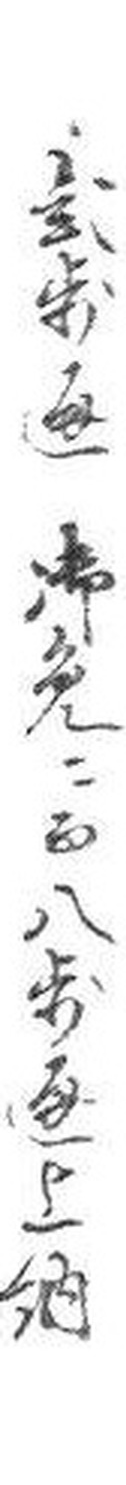弐歩通御免ニ而八歩通上納
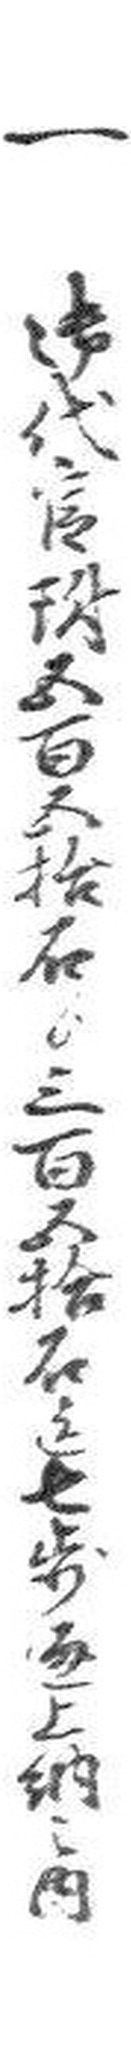一御代官附五百五拾石ゟ三百五拾石迄七歩通上納之内
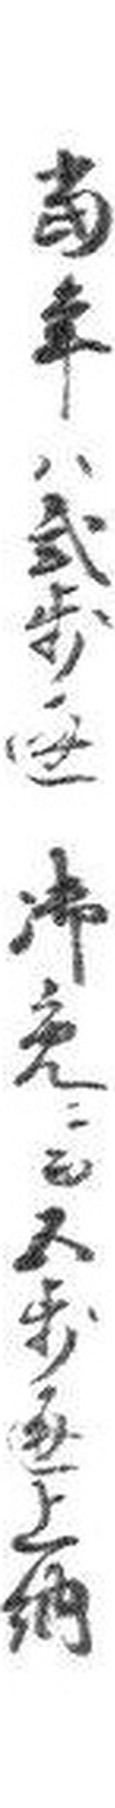当年ハ弐歩通御免ニ而五歩通上納
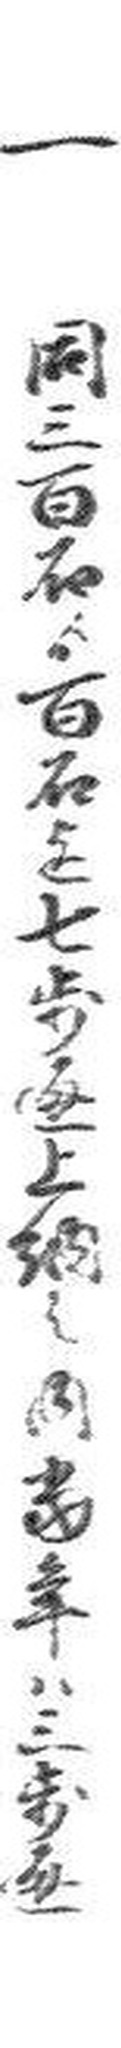一同三百石ゟ百石迄七歩通上納之内当年ハ三歩通
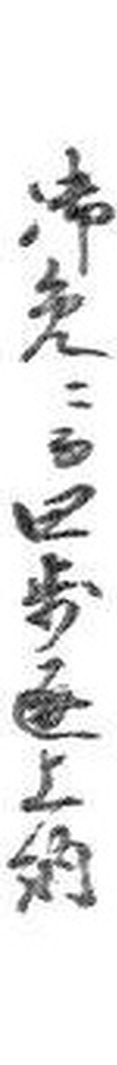御免ニ而四歩通上納
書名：家譜 二十八 吉邦公 従宝永七年七月五日到正徳元年十二月
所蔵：福井県文書館 Fukui Prefectural Archives
